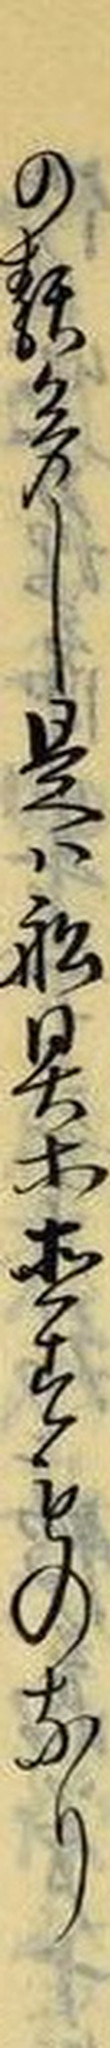の類多し是ハ船具等直すものなり
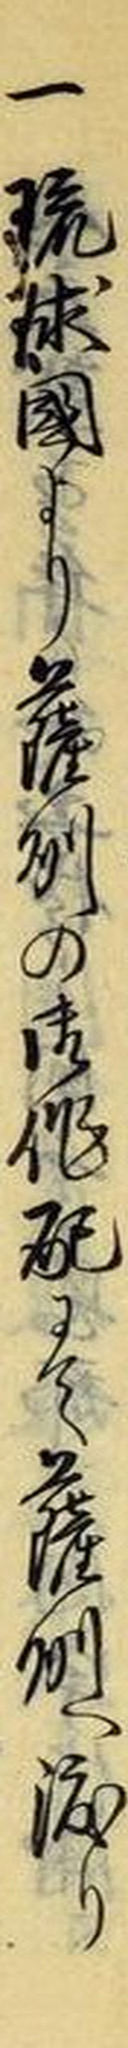一琉球国より薩州の御作配にて薩州へ渡り
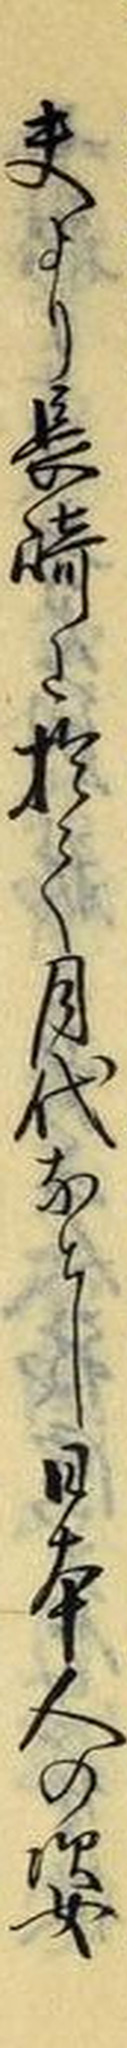夫より長崎に於て月代なとし日本人の姿
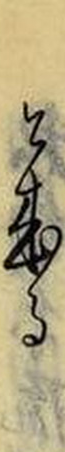と成る
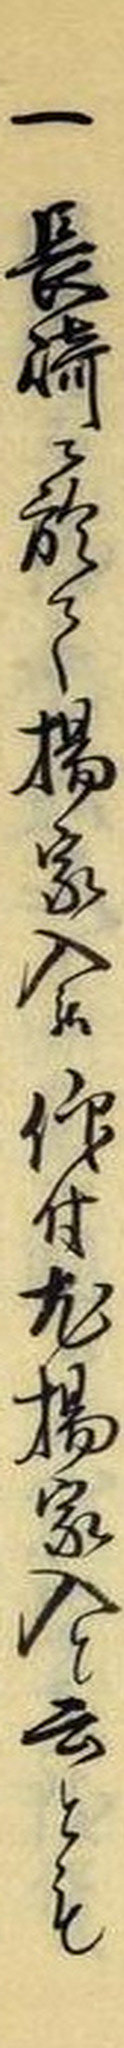一長崎に於て揚家入被仰付尤揚家入と云とも
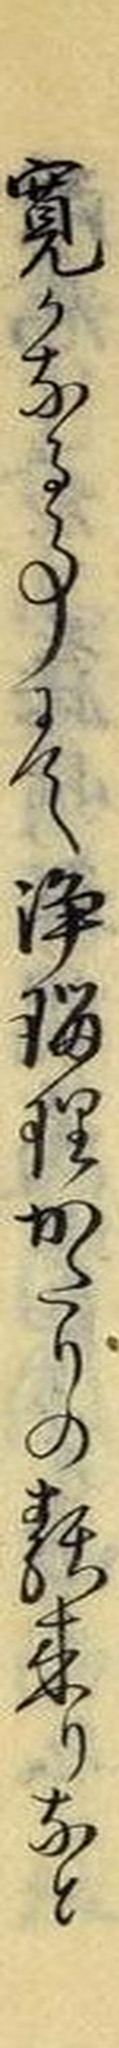寛かなる事にて浄瑠璃かたりの類来りなと
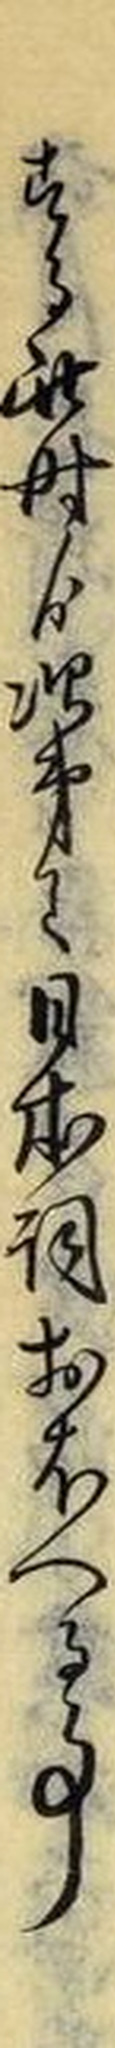する此時ゟ次第に日本詞おほへる事
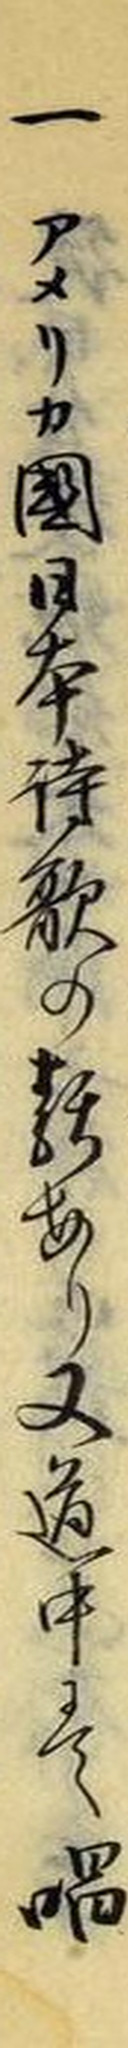一アメリカ国日本詩歌の類あり又道中にて唱
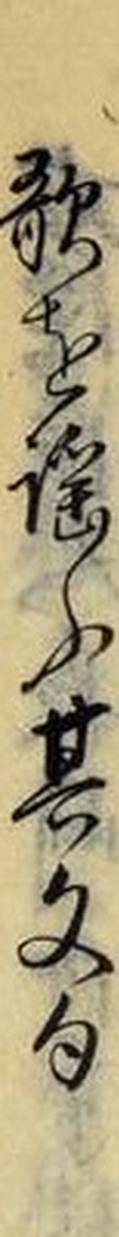歌を謡ふ其文句
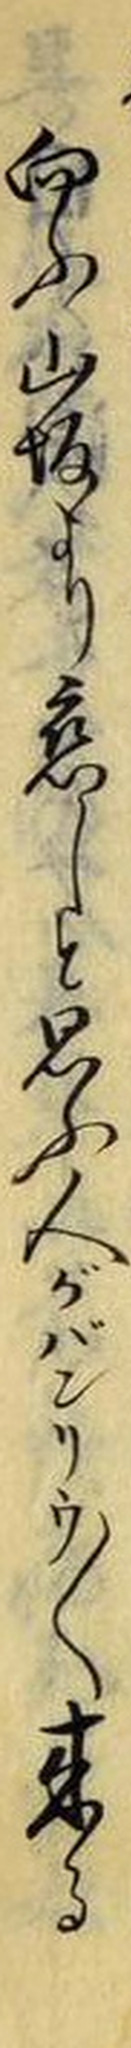向ふ山坂より恋しと思ふ人がバンリウ〳〵来る

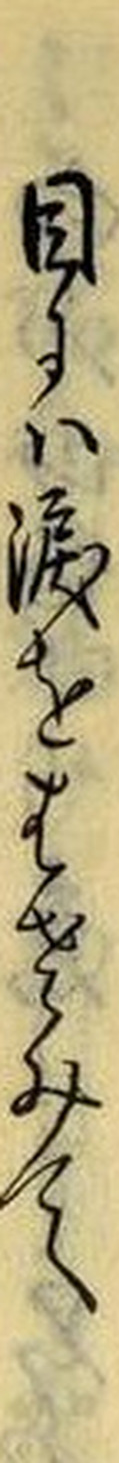目には涙をはさみて
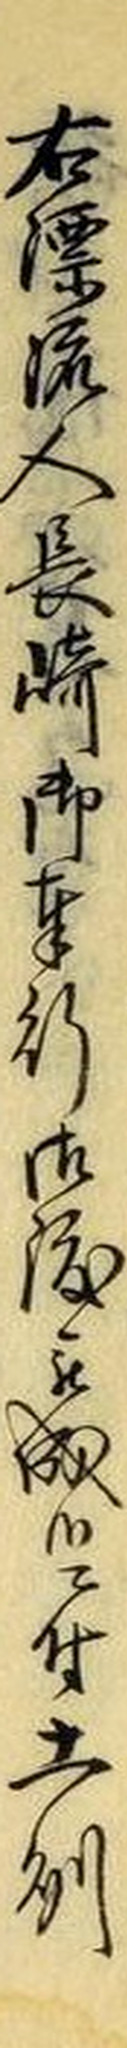右漂流人長崎御奉行御渡被成候に付き土州
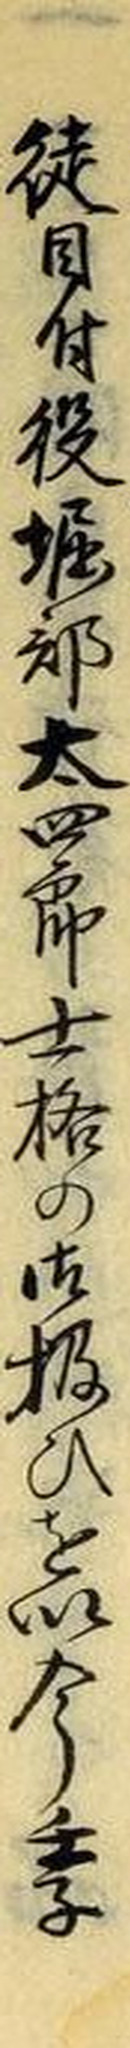徒目付役堀部太四郎士格の御扱ひを以今季
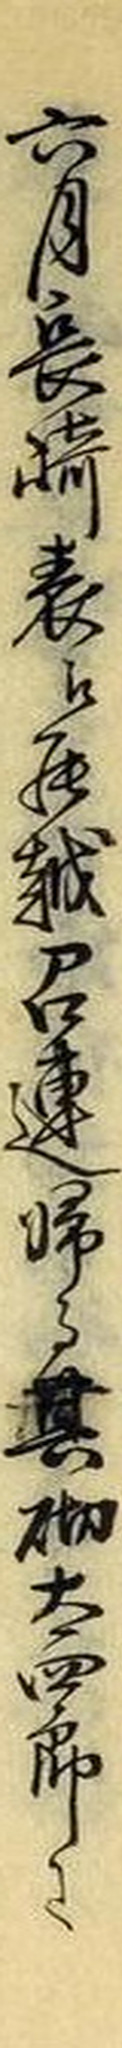六月長崎表え罷越召連帰る其砌太四郎に
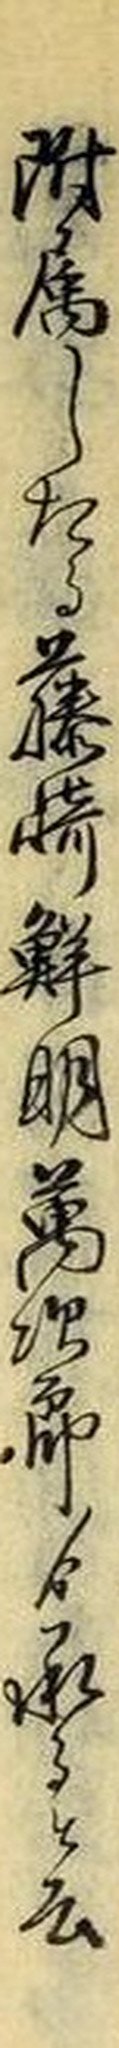附属したる藤崎鮮明万次郎ゟ承ると云
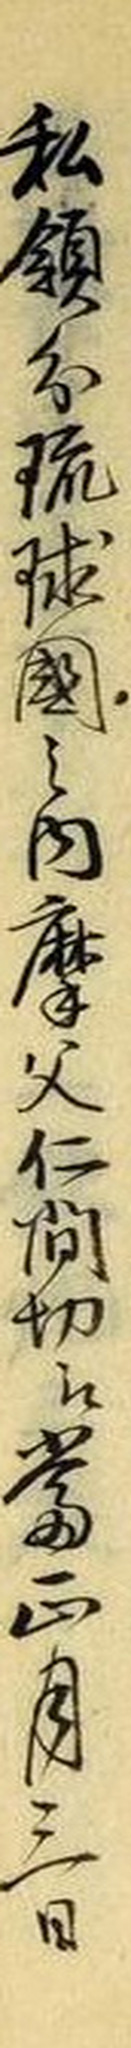私領分琉球国之内摩文仁間切え当正月三日
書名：漂客談奇（備考雑録写8）
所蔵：福井県文書館 Fukui Prefectural Archives
